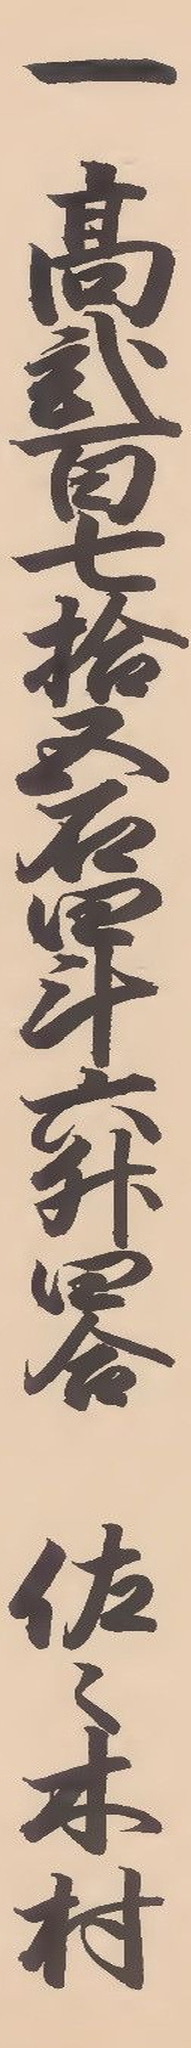一高弐百七拾五石四斗六升四合佐々木村
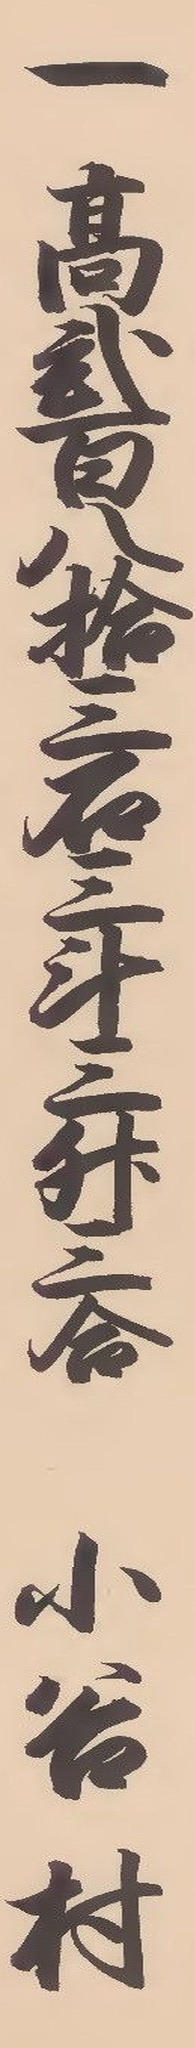一高弐百八拾三石三斗三升三合小谷村

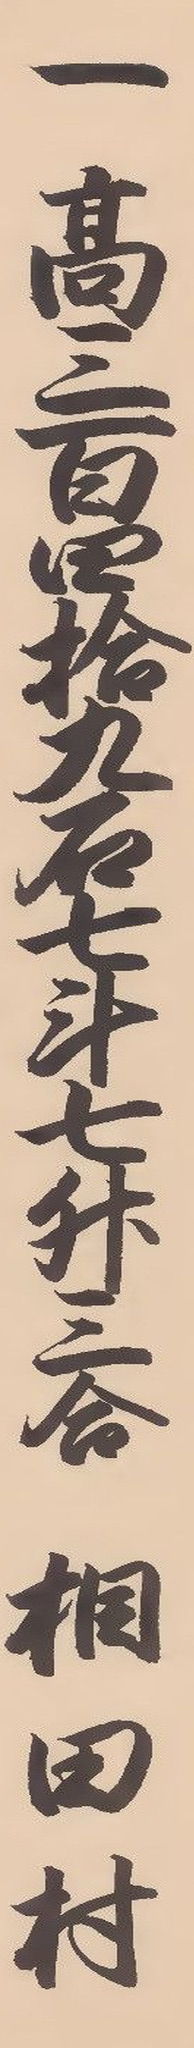一高三百四拾九石七斗七升三合相田村
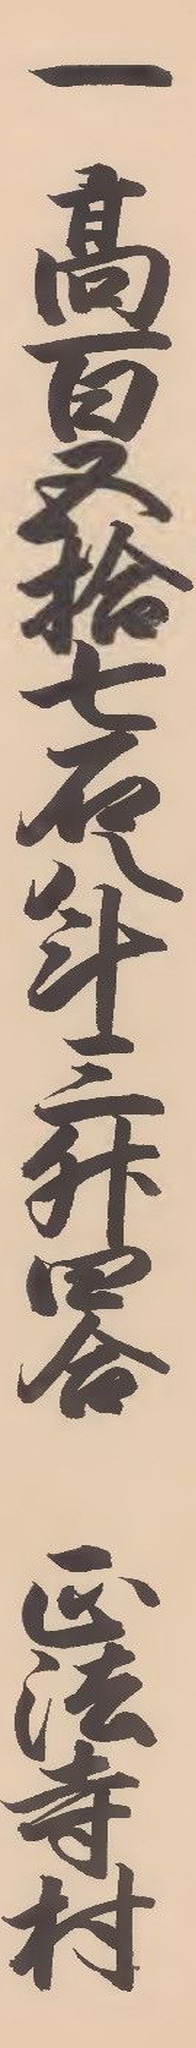一高百五拾七石八斗三升四合正法寺村
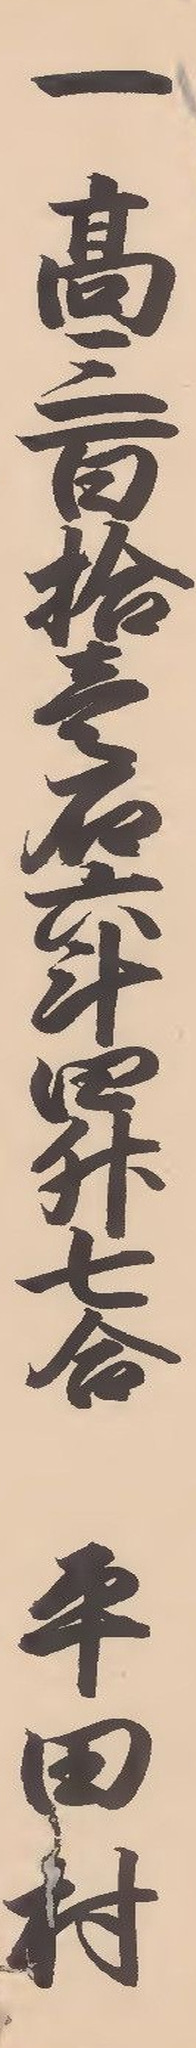一高三百拾壱石六斗四升七合平田村
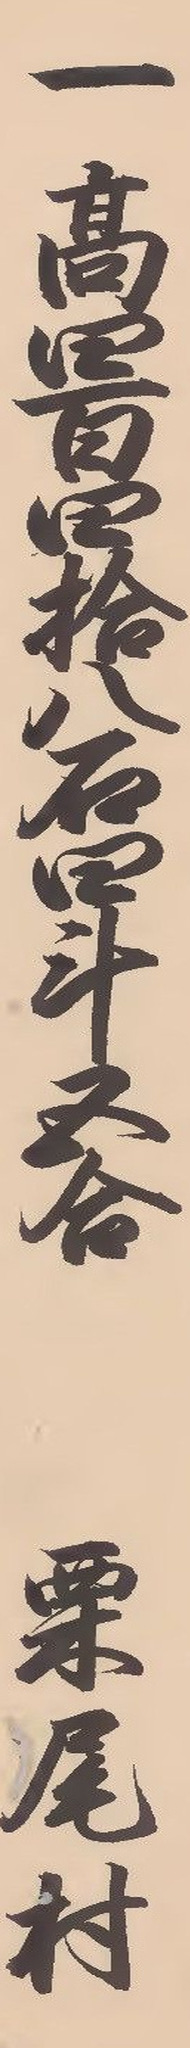一高四百四拾八石四斗五合栗尾村
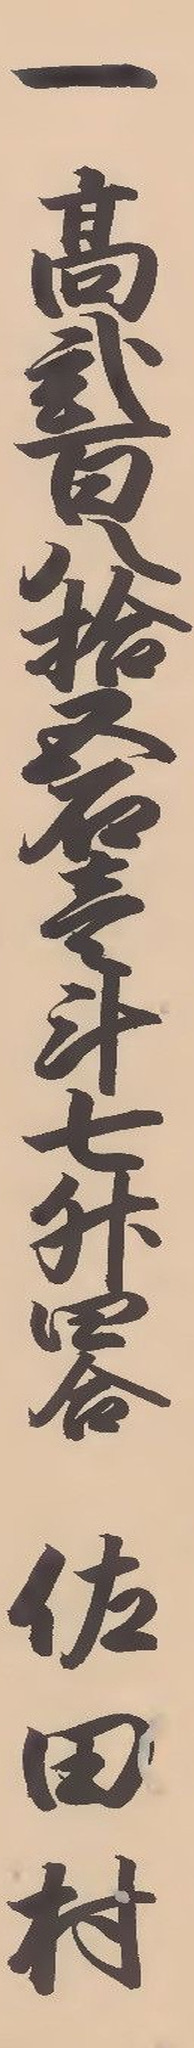一高弐百八拾五石壱斗七升四合佐田村
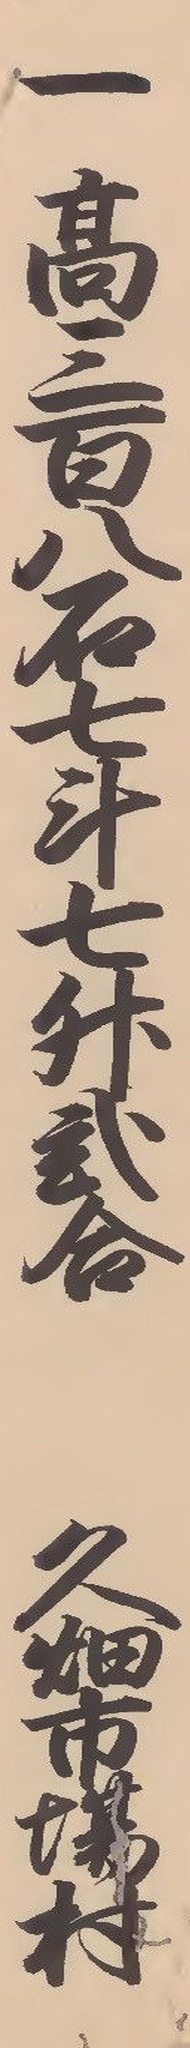一高三百八石七斗七升弐合久畑市場村
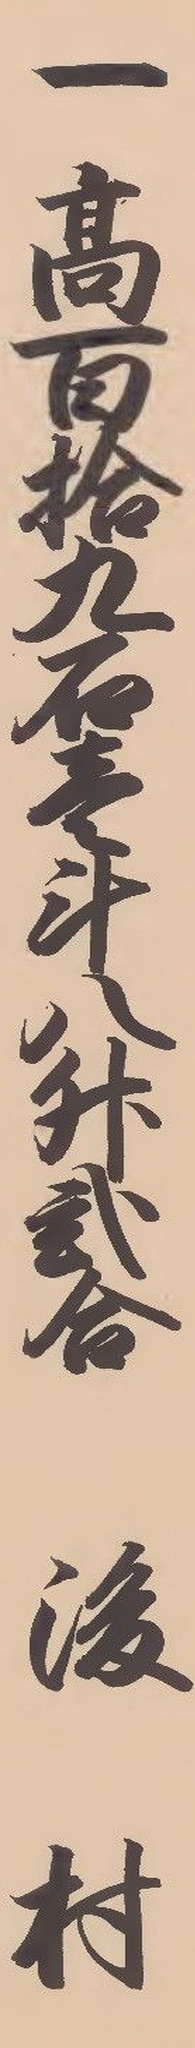一高百拾九石壱斗八升弐合後村
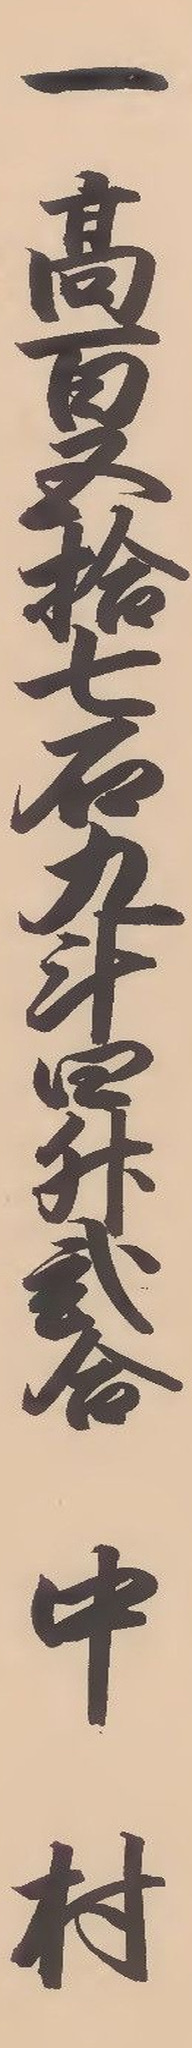一高百五拾七石九斗四升弐合中村

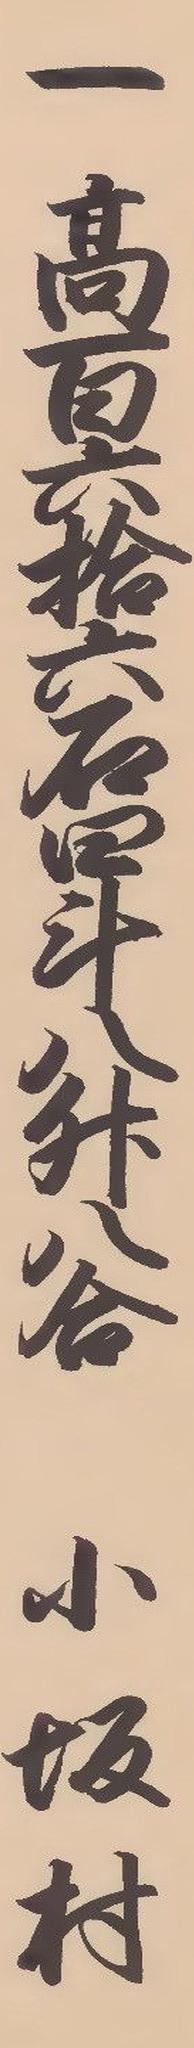一高百六拾六石四斗八升八合小坂村
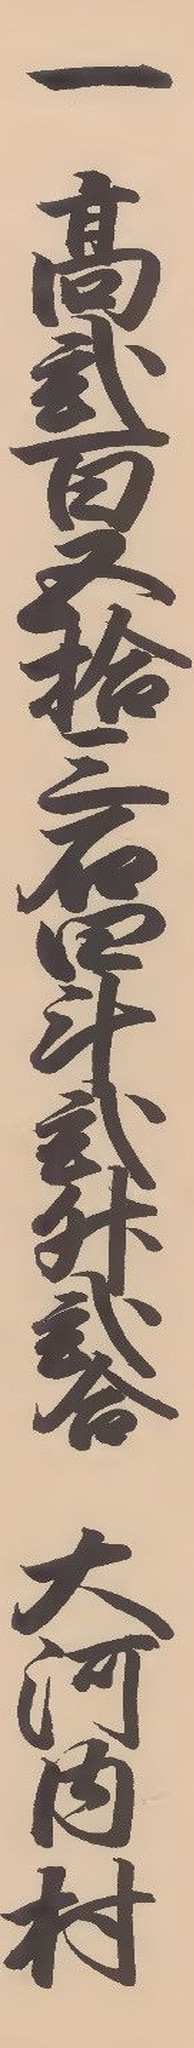一高弐百五拾三石四斗弐升弐合大河内村
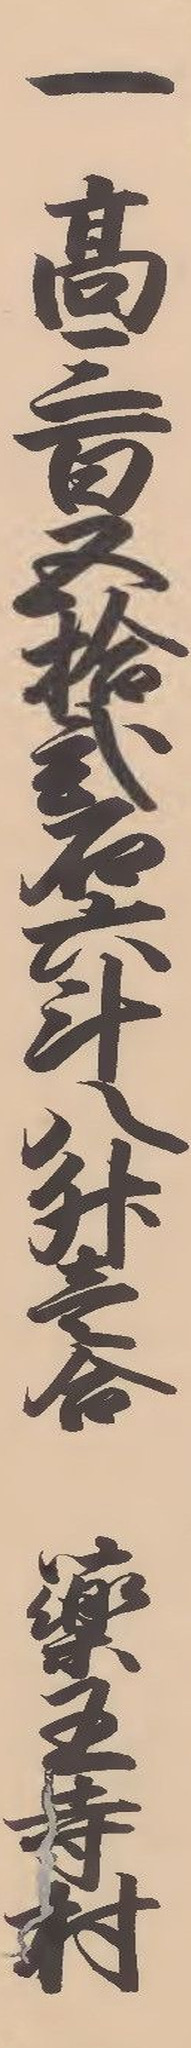一高三百五拾弐石六斗八升壱合薬王寺村
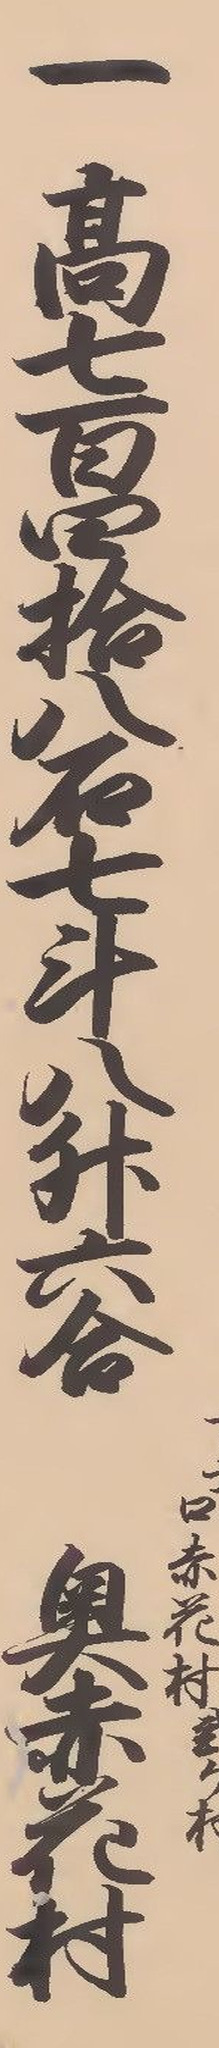一高七百四拾八石七斗八升六合奥赤花村
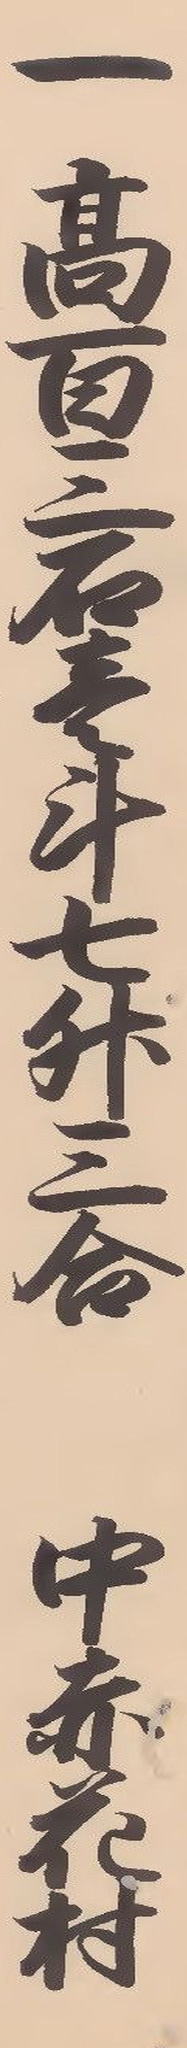一高百三石壱斗七升三合中赤花村
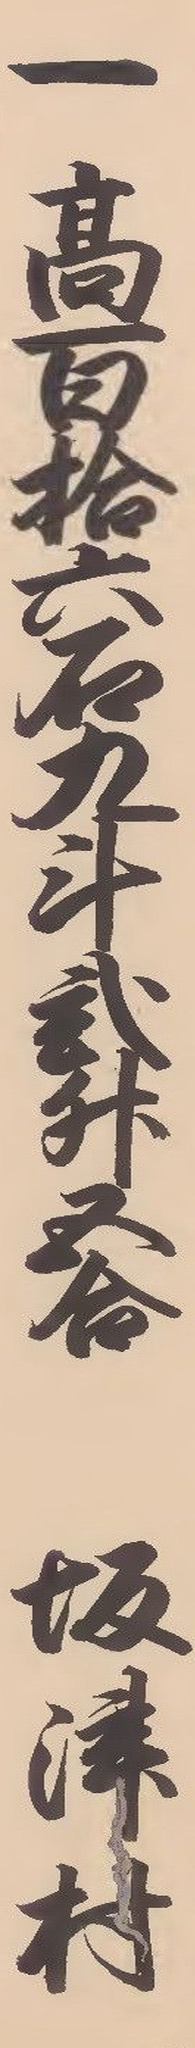一高百拾六石九斗弐升五合坂津村
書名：但馬国郷帳
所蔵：国立公文書館 National Archives of Japan
